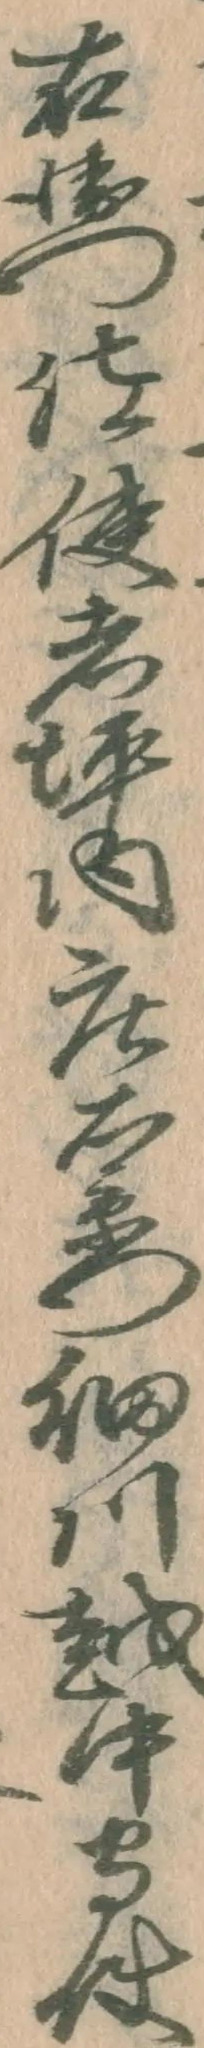右衛門佐使者坪内庄右衛門細川越中守使
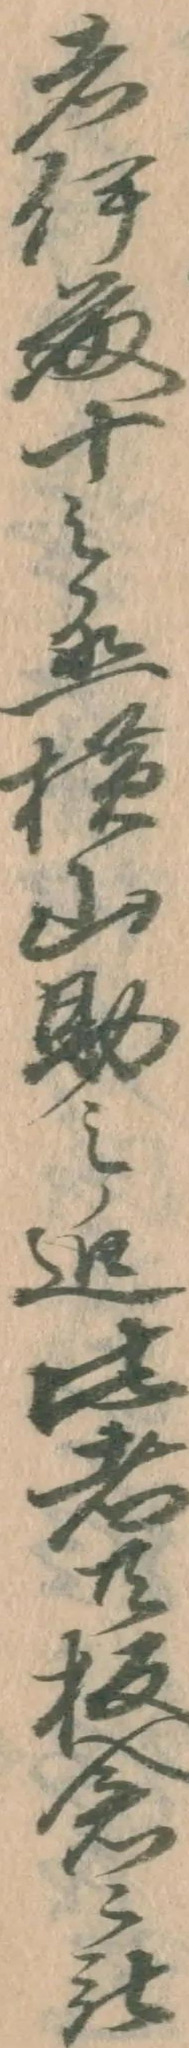者伊藤十之丞横山助之進此者共板倉に被
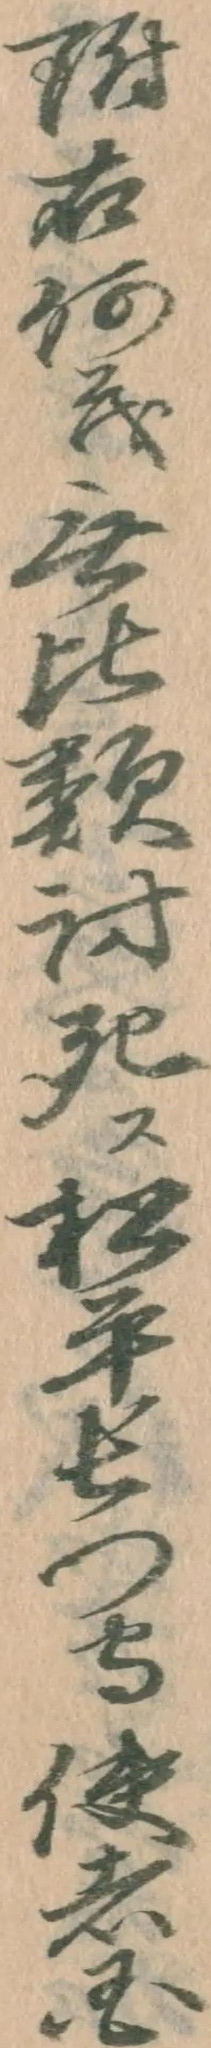附右何茂無比類討死す松平長門守使者国
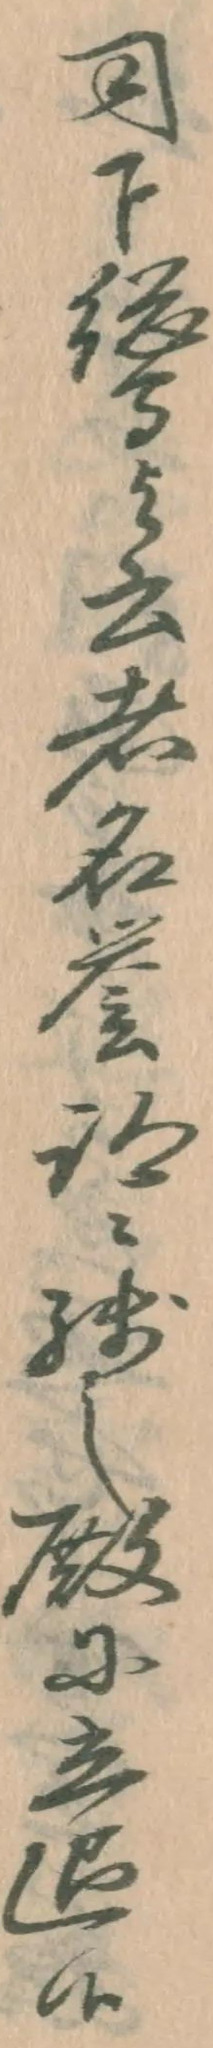司下総守与云者名誉跡に残し殿尓立退候
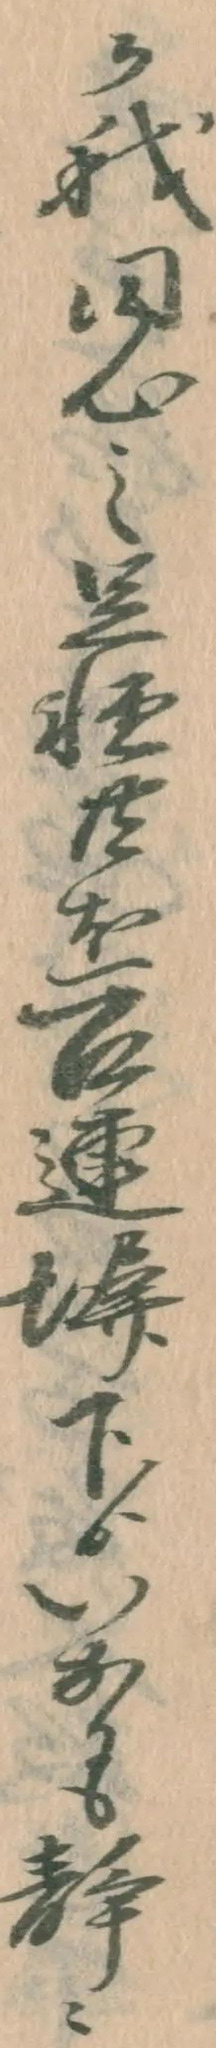か我同心之足軽共を召連塀下ゟいか尓も静に
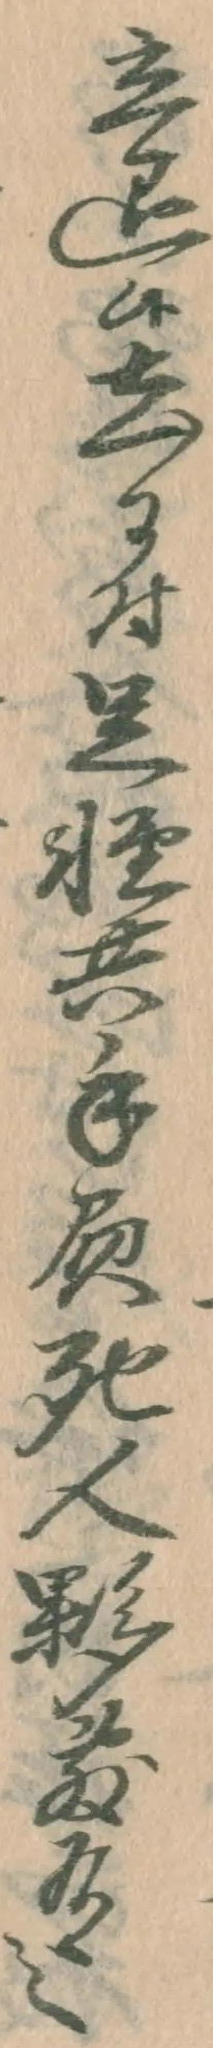立退候者尓付足軽共手負死人夥敷有之
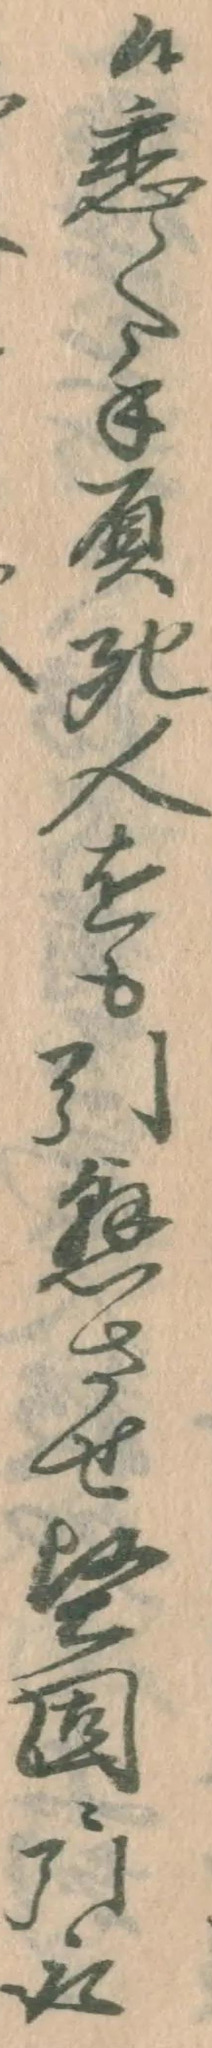候悉く手負死人をも引懸させ堅固に引取
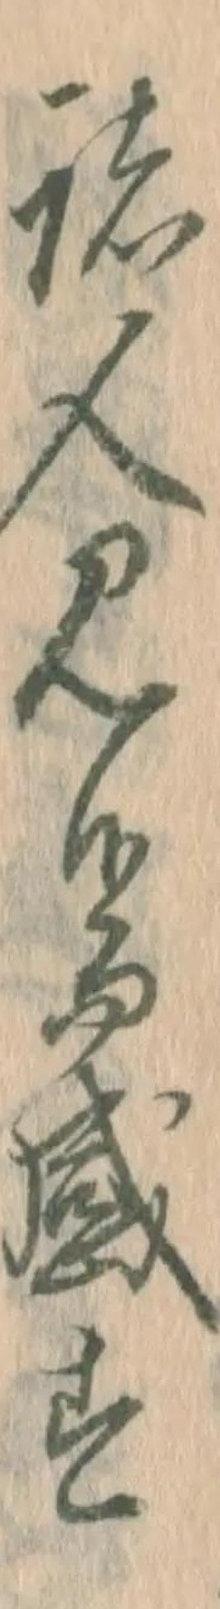諸人見候而感春
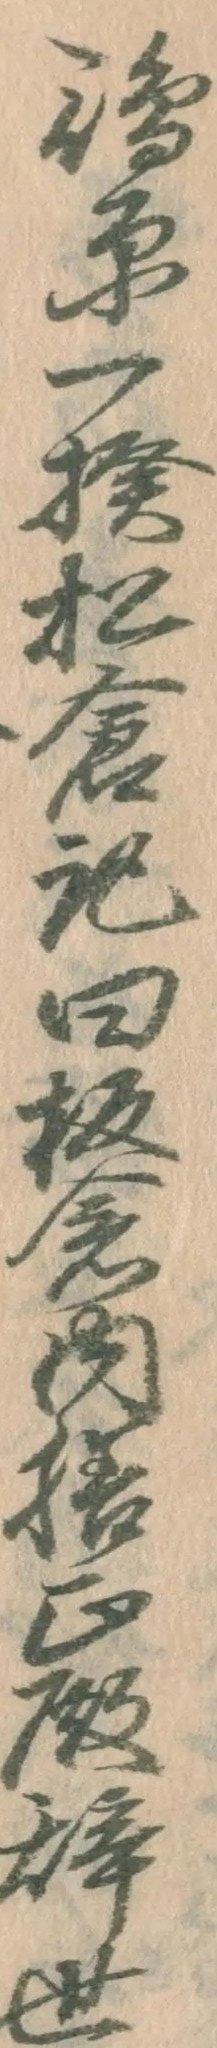島原一揆松倉記曰板倉内膳正殿辞世
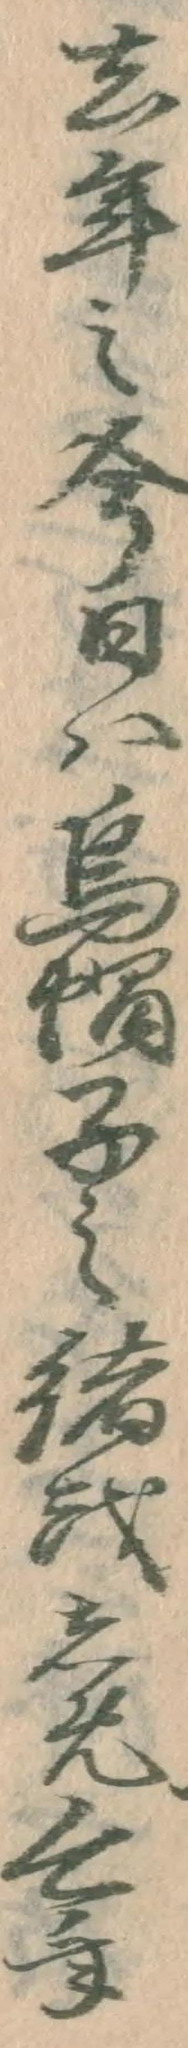去年之今日は烏帽子之緒越志免今年
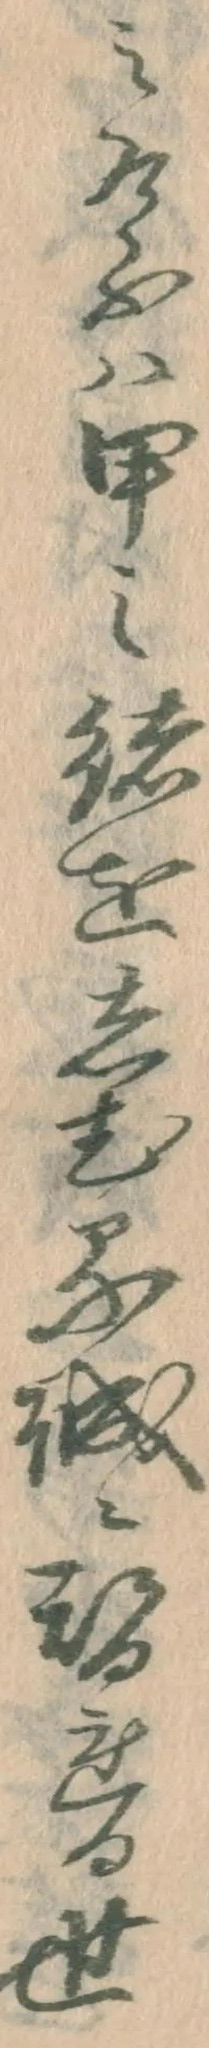之けふは甲之緒を志むる誠に替連る世
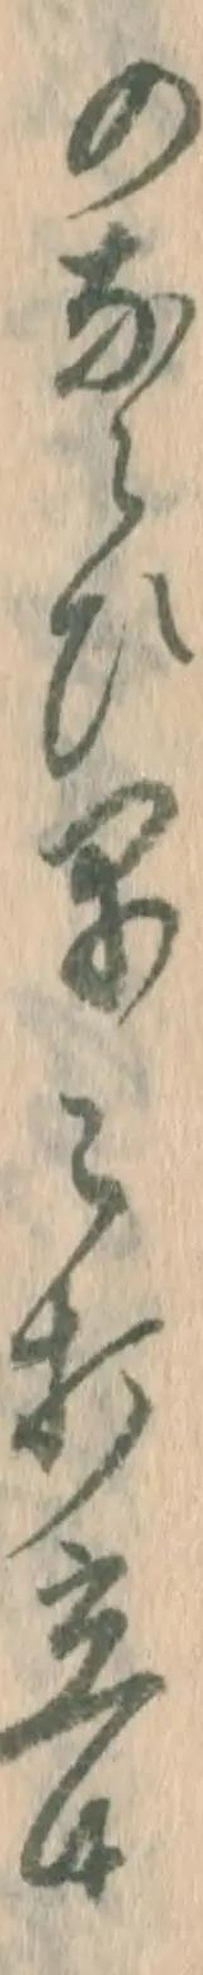のならひ早々打立候
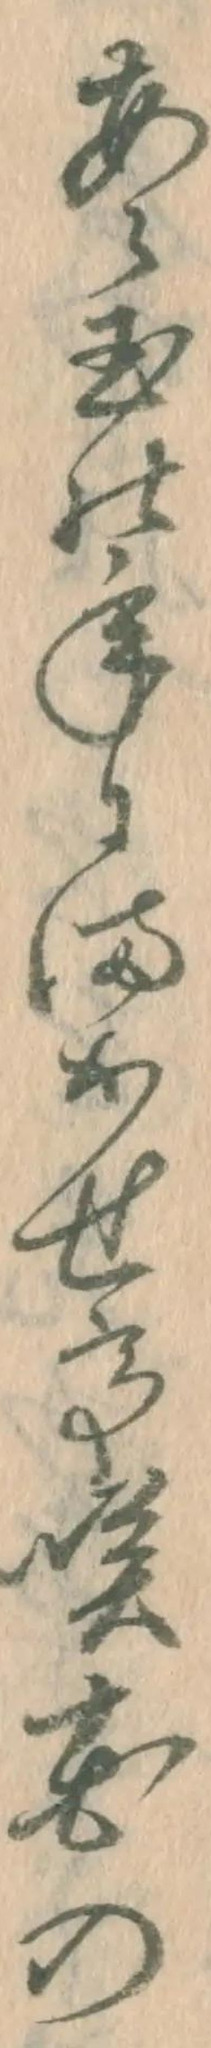あら玉能年尓満かせ亭咲花の

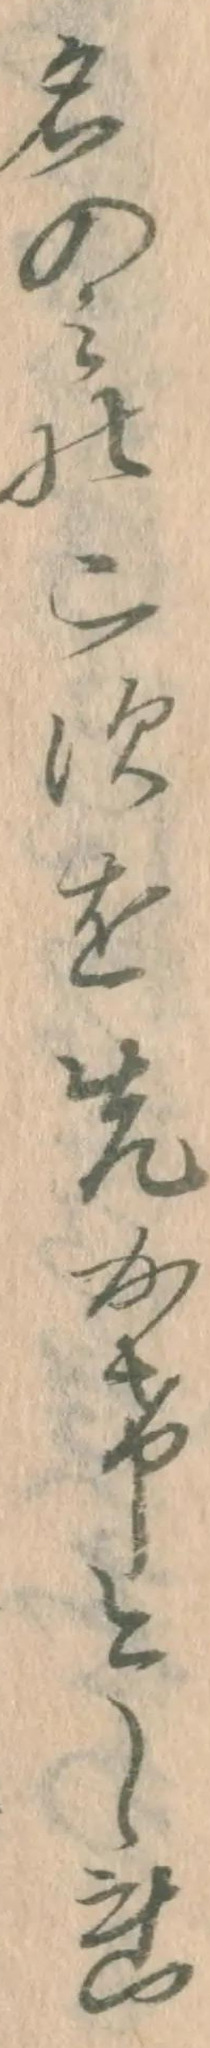名のみ能こ須を先加希とし連
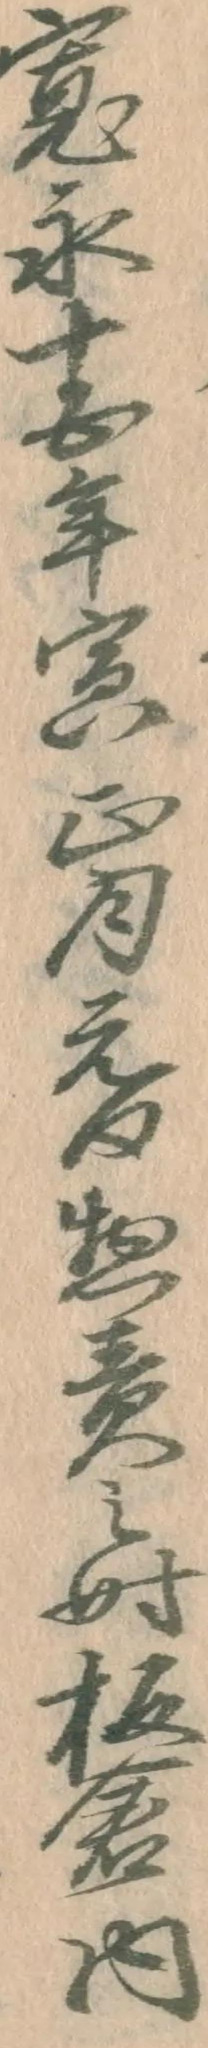寛永十五年寅正月元日惣責之時板倉内
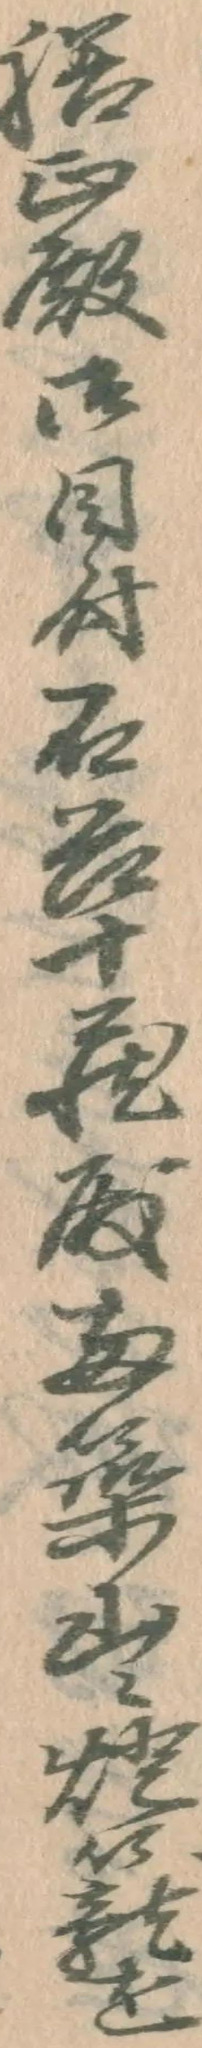膳正殿御目付石谷十蔵殿両築山に燈籠を
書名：切支丹御退治記 49巻. [5]
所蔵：国立国会図書館 National Diet Library, JAPAN
